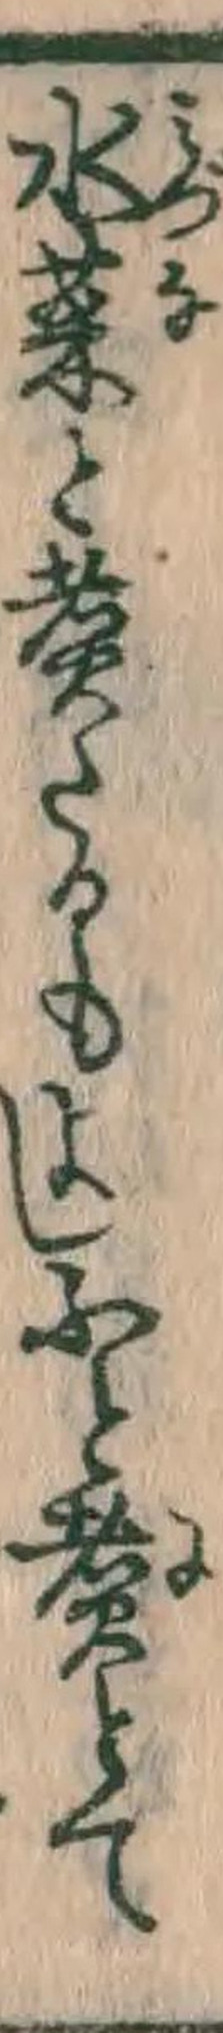水菜と煮たるもよしふと煮とて
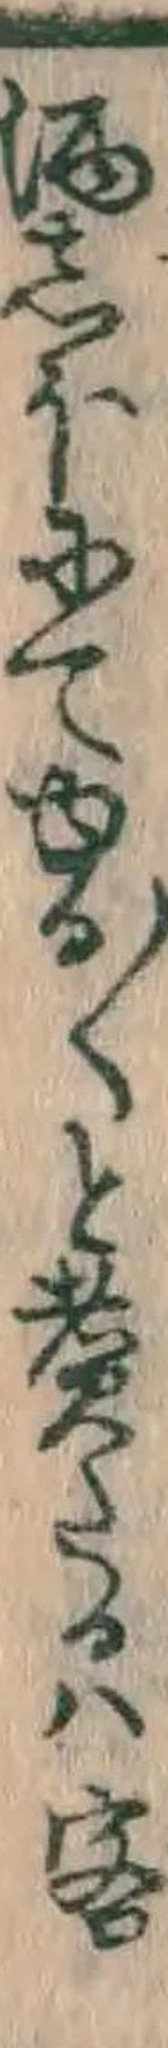酒しほにてゆる〳〵と煮たるは客
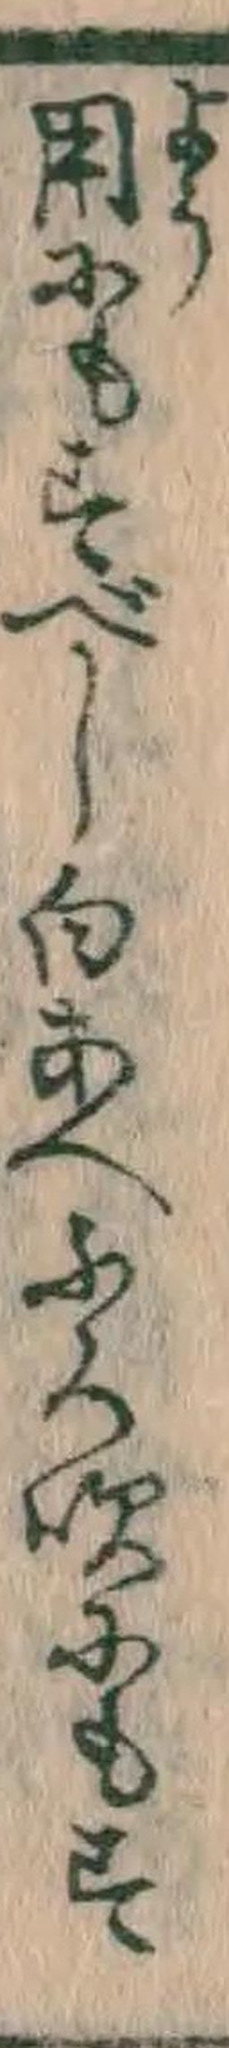用にもすべし白あへふろ吹にもす
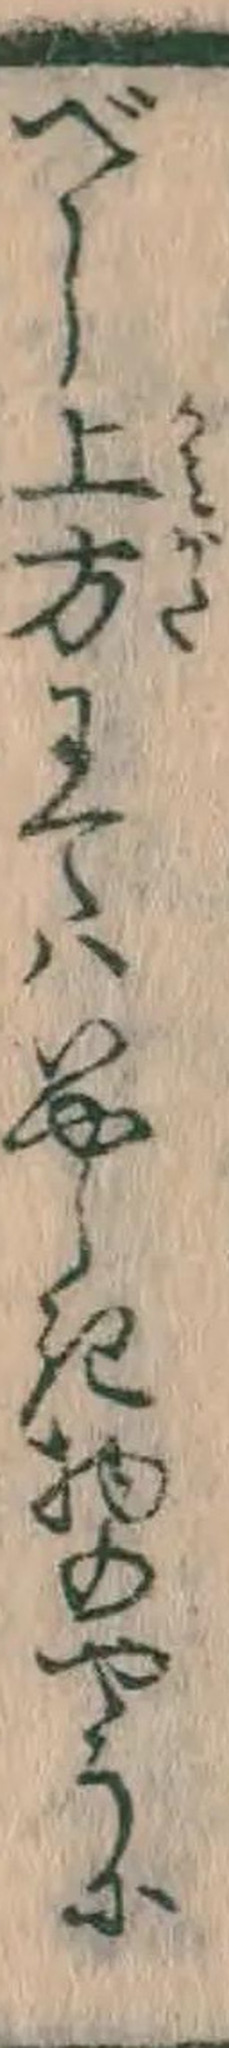べし上方にてはいやしき物のやうに
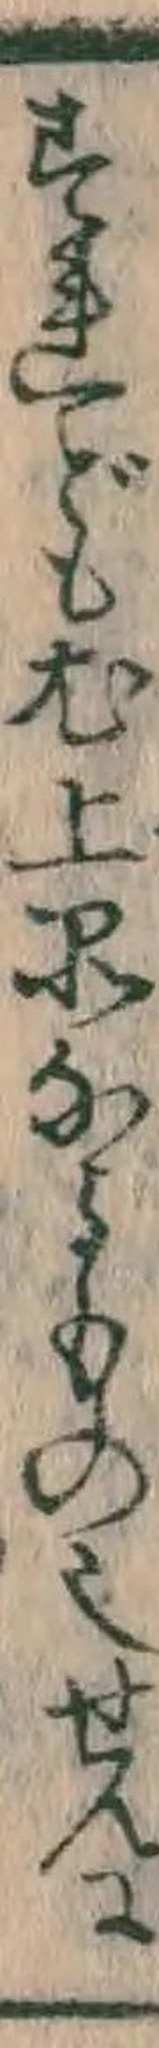すれども尤上品なるもの也せんに
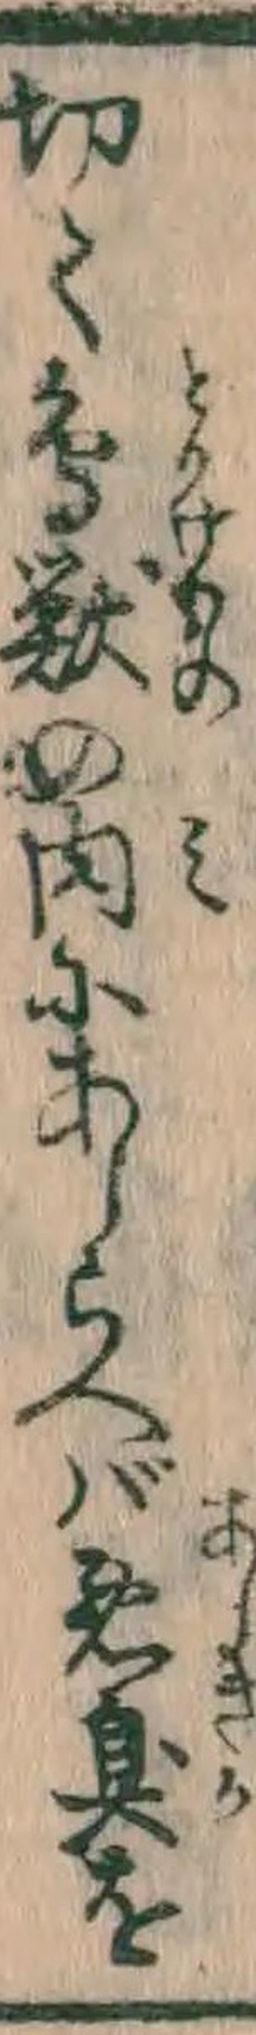切て鳥獣の肉にあしらへば悪臭を
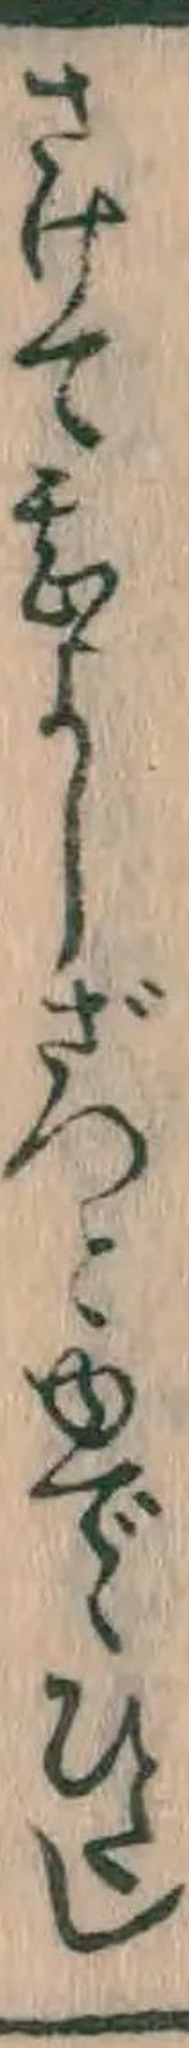さけて甚よしざつとゆでゝひたし
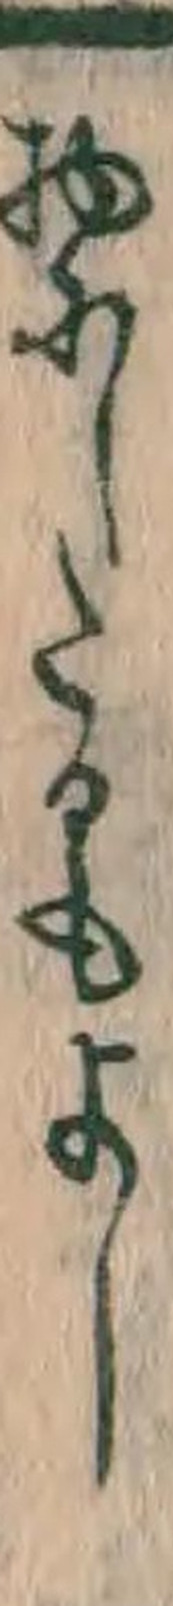物にしたるもよし
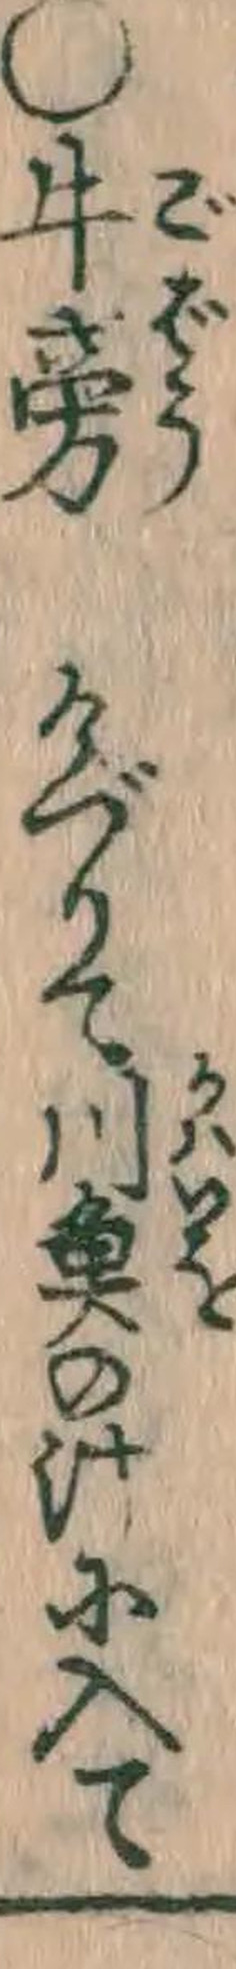○牛蒡けづりて川魚の汁に入て
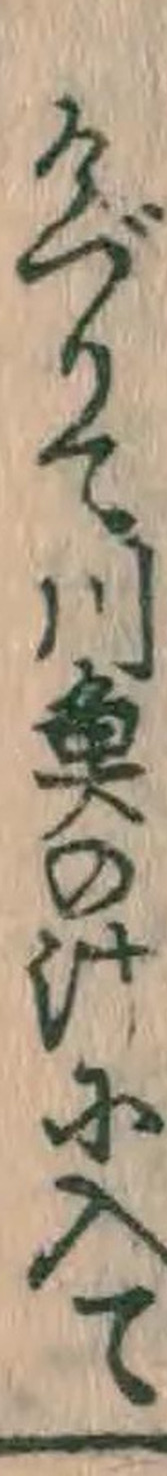○牛蒡けづりて川魚の汁に入て
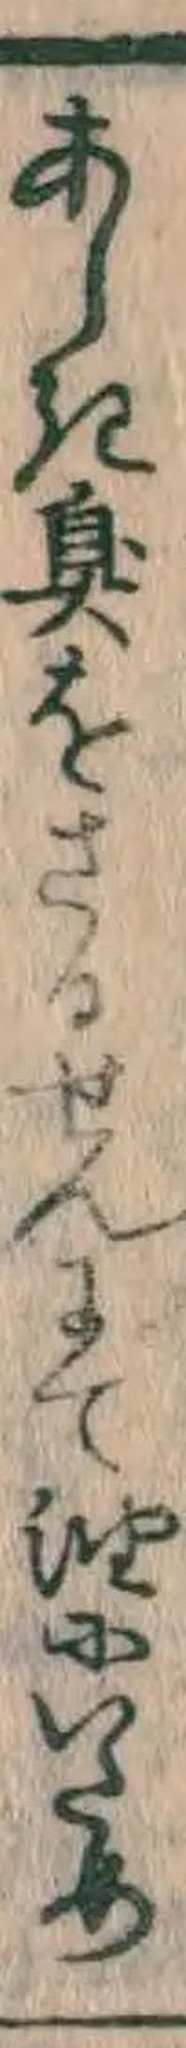あしき臭をさるせんにて油にいため
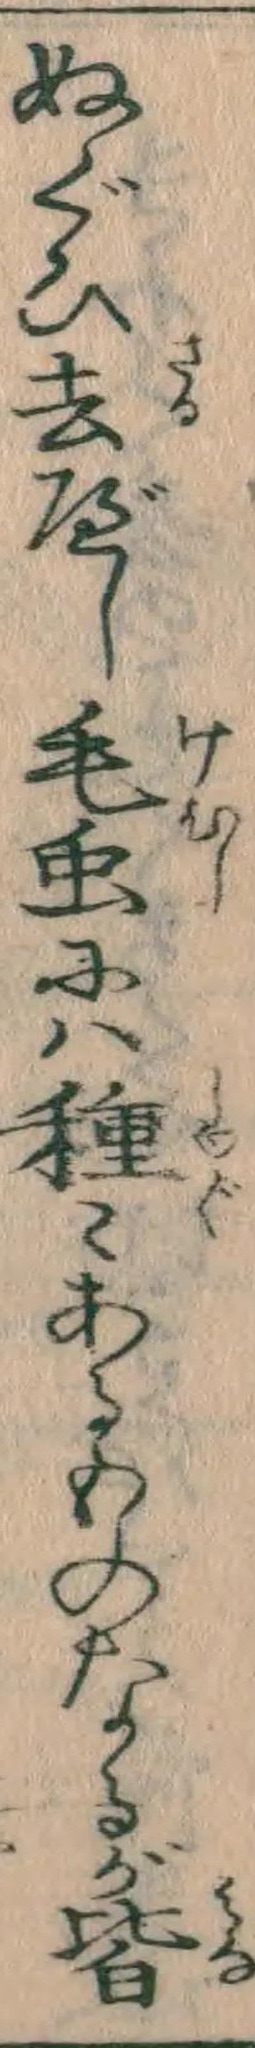ぬぐひ去べし毛虫には種々あるものなるが皆
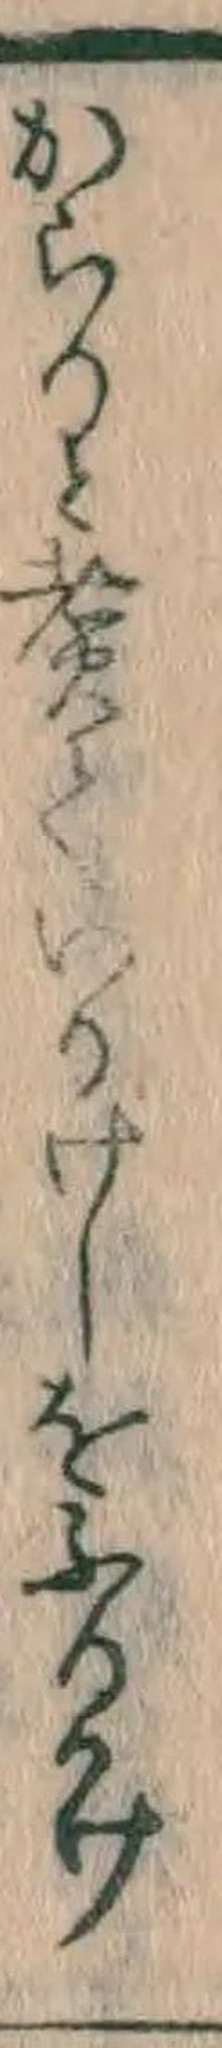からりと煮ていりけしをふりかけ
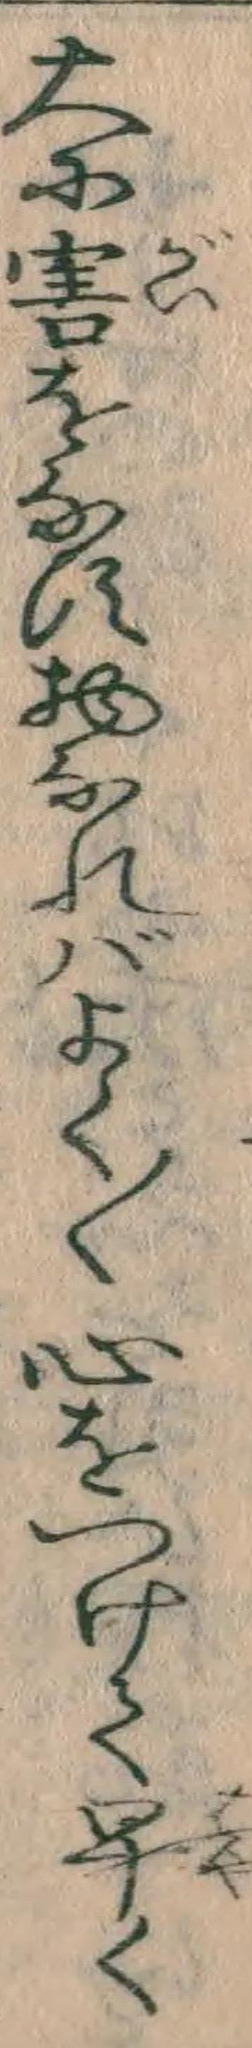大に害をなす物なればよく〳〵心をつけて早く
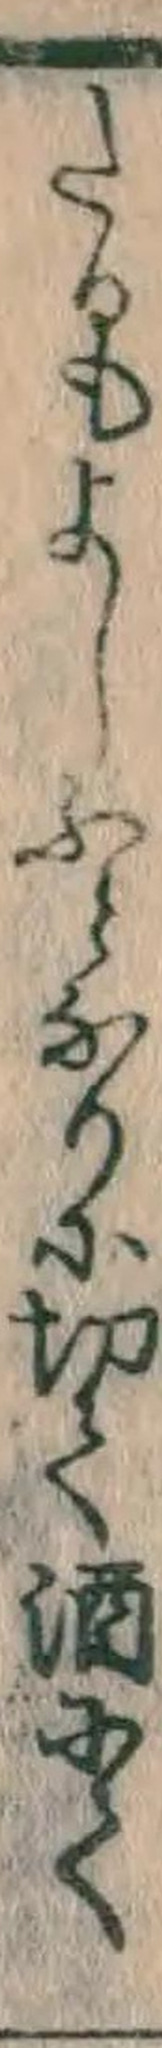たるもよしふとなりに切て酒にて
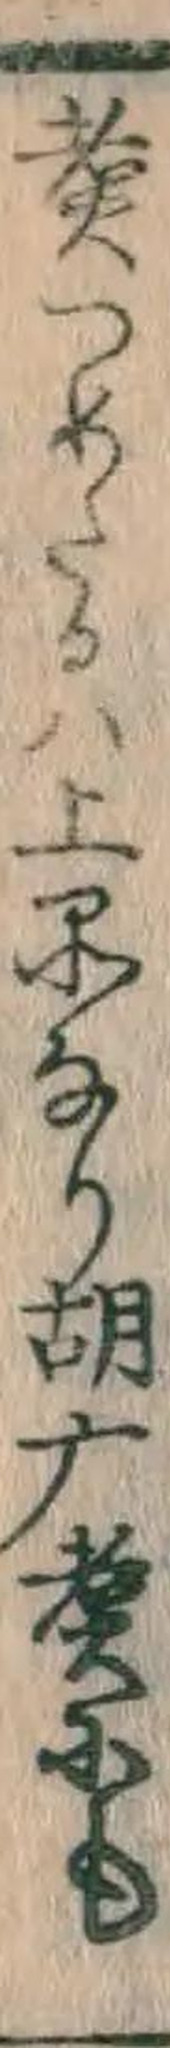煮つめたるは上品なり胡麻煮にも
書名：広益秘事大全 3巻. [5]
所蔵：国立国会図書館 National Diet Library, JAPAN
